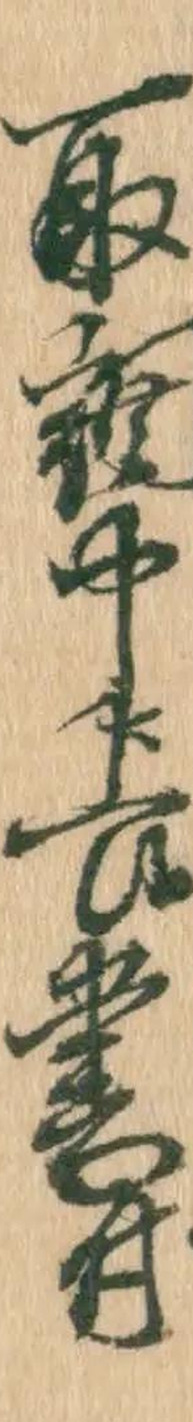取調申上候書付
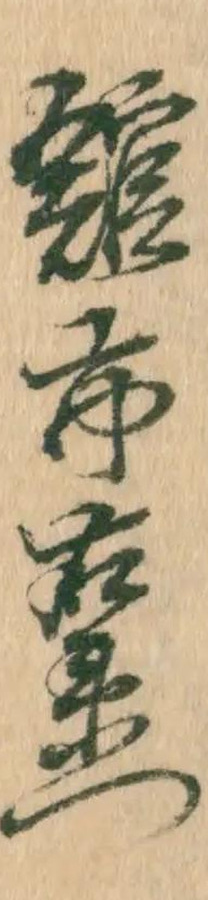館市右衛門
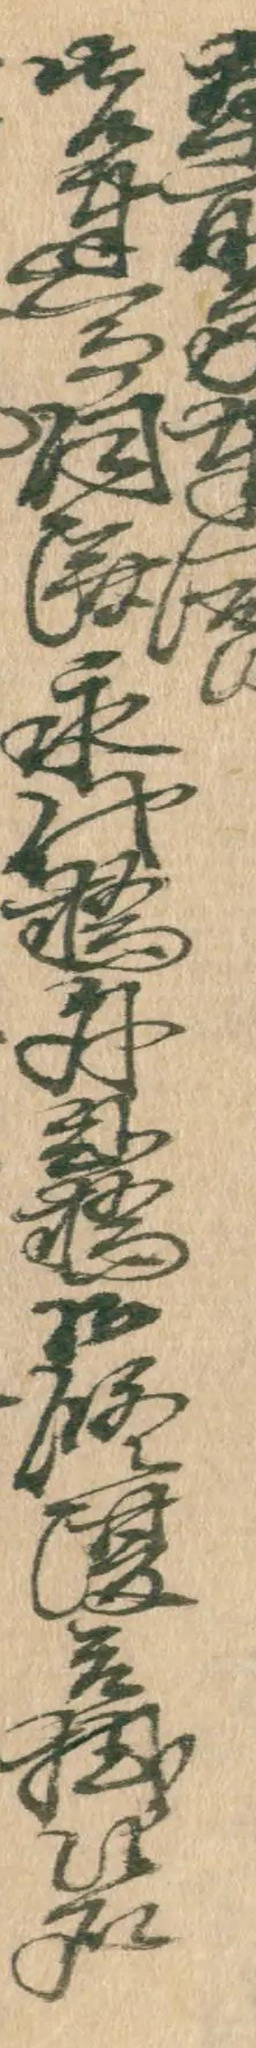先達而伺済永代橋外弐橋御修復差掛り候処
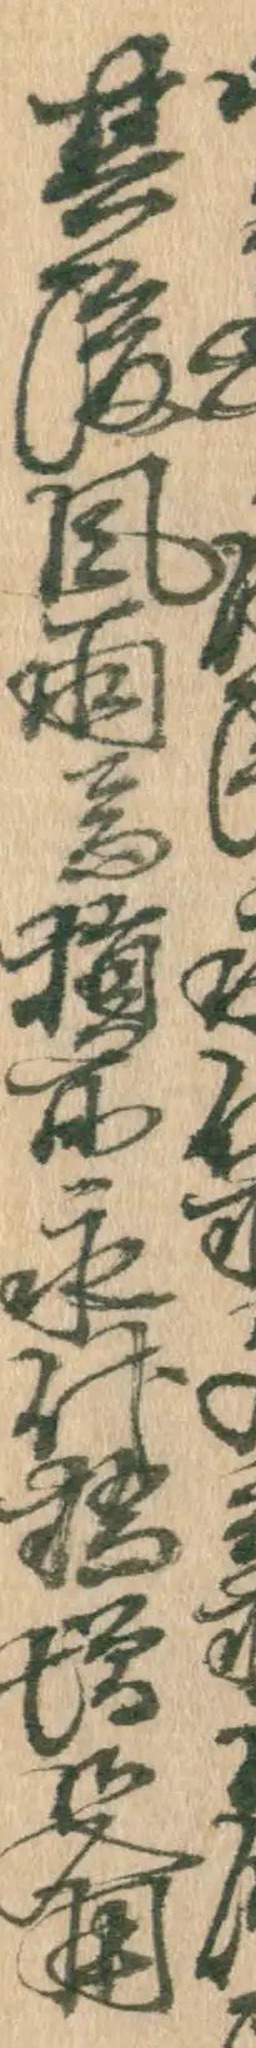其後風雨ニ而損所永代橋増御入用
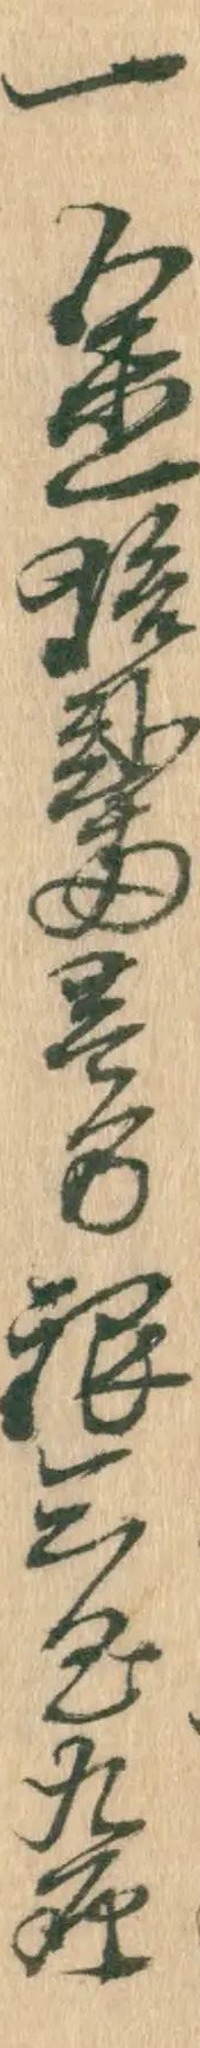一金拾弐両壱分銀三匁九厘

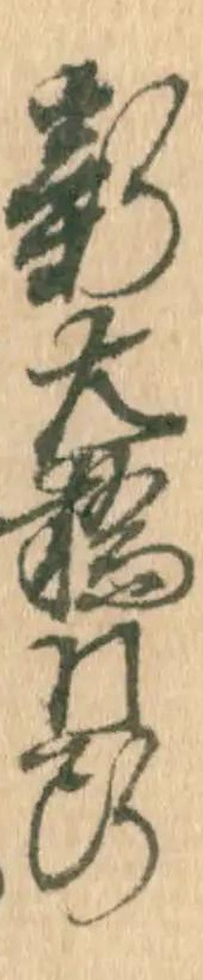新大橋同断
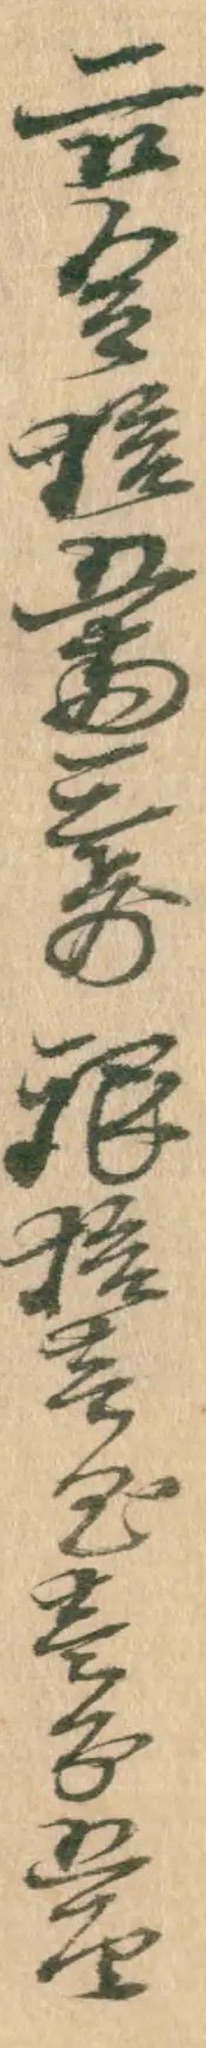弐口金拾五両三歩銀拾壱匁壱分五厘
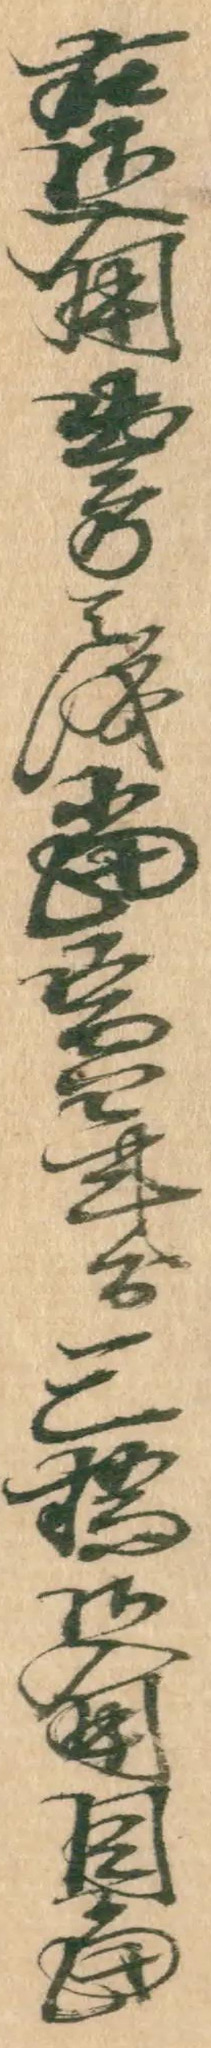右御入用出方之儀当寅年分三橋御入用目当
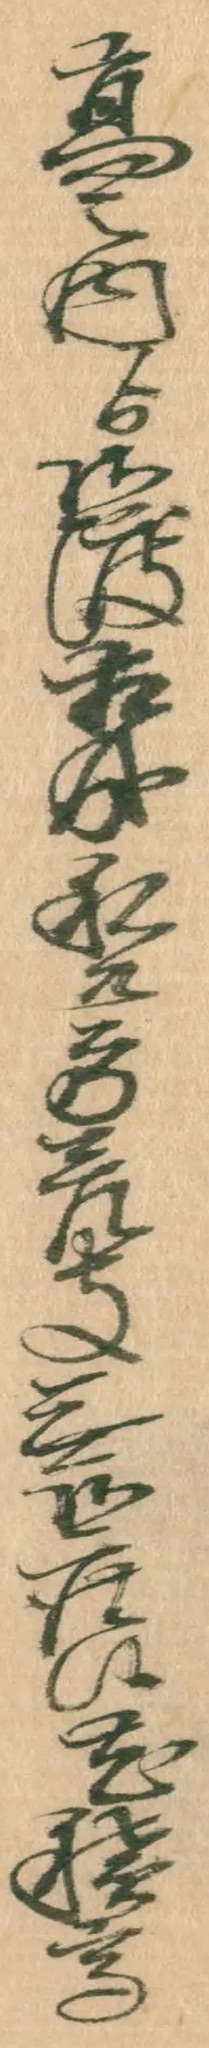高之内ゟ御渡相成私共方差支無御座候尤積高
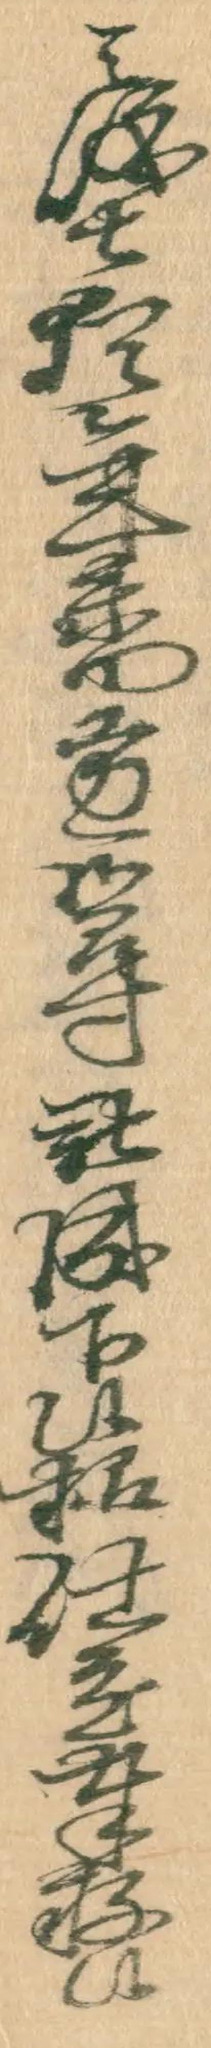之儀は猶年番方へ御尋被成下候様仕度奉存候
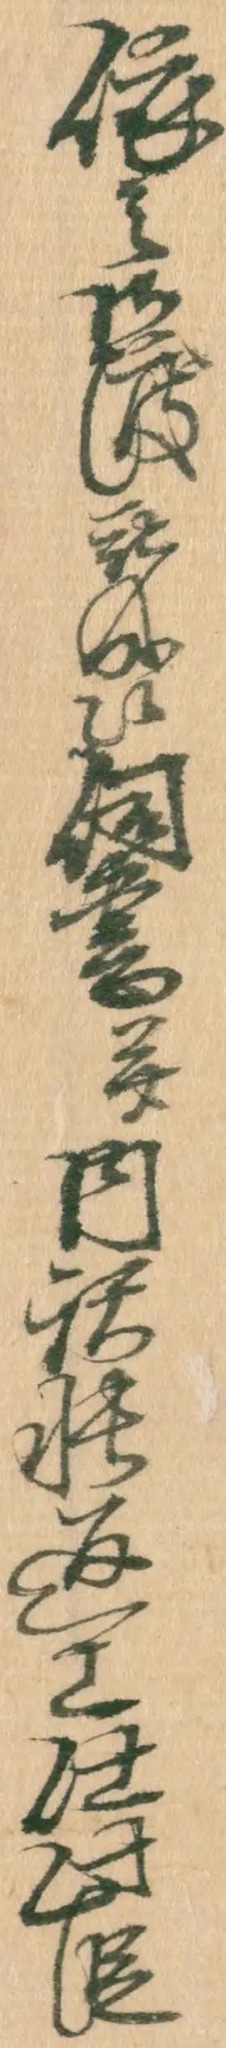依之御渡被成候伺書并内訳帳返上仕此段
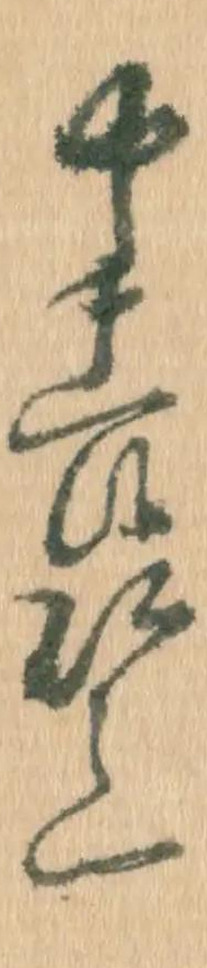申上候以上

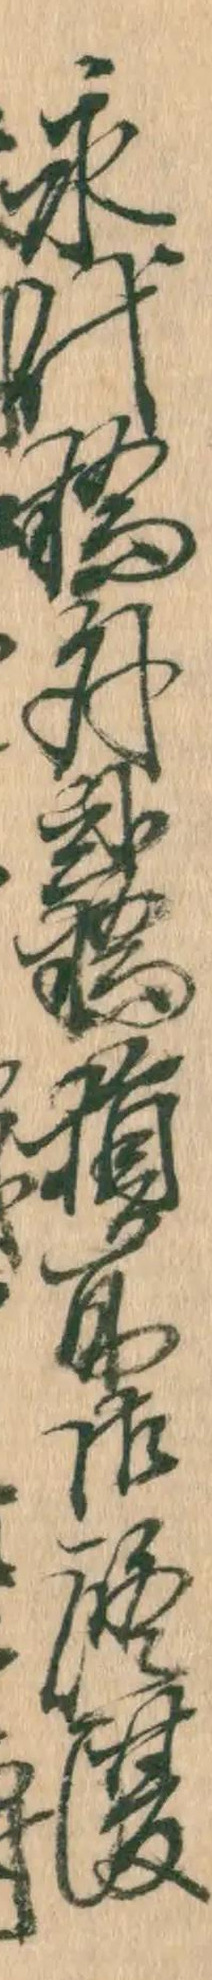永代橋外弐橋損所御修復
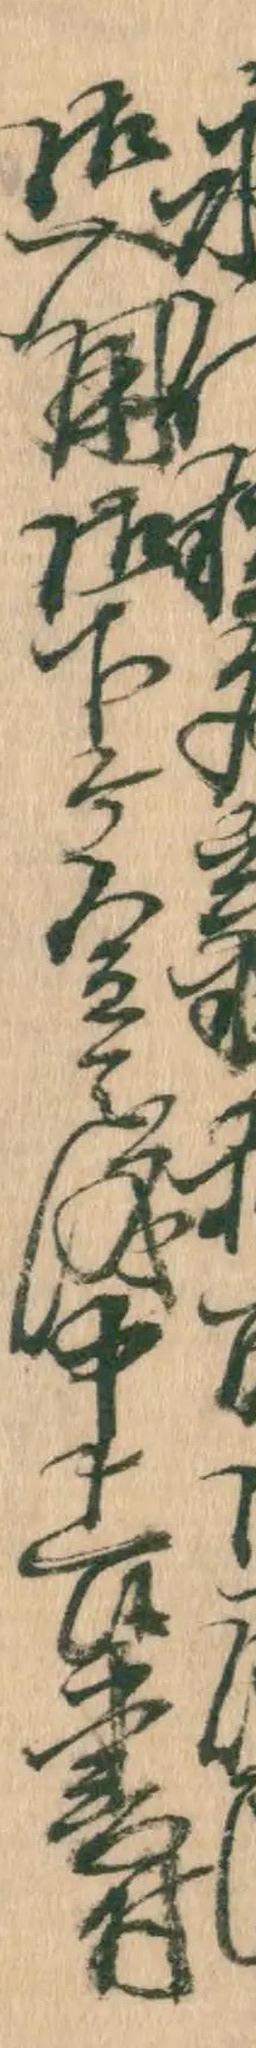御入用御下ケ金之儀申上候書付
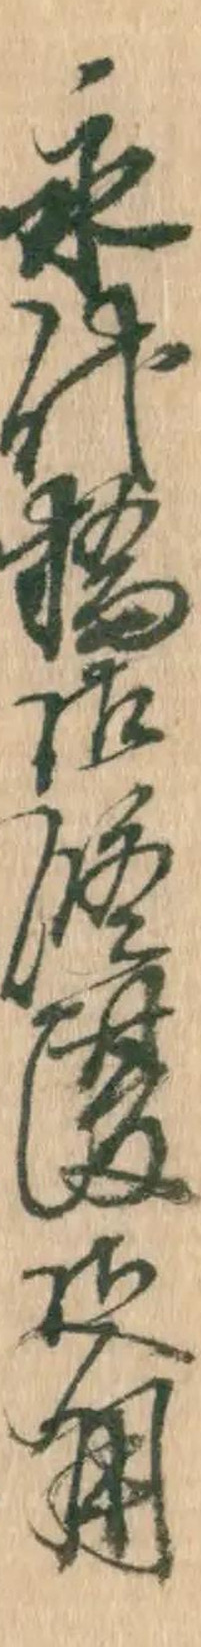永代橋御修復御入用
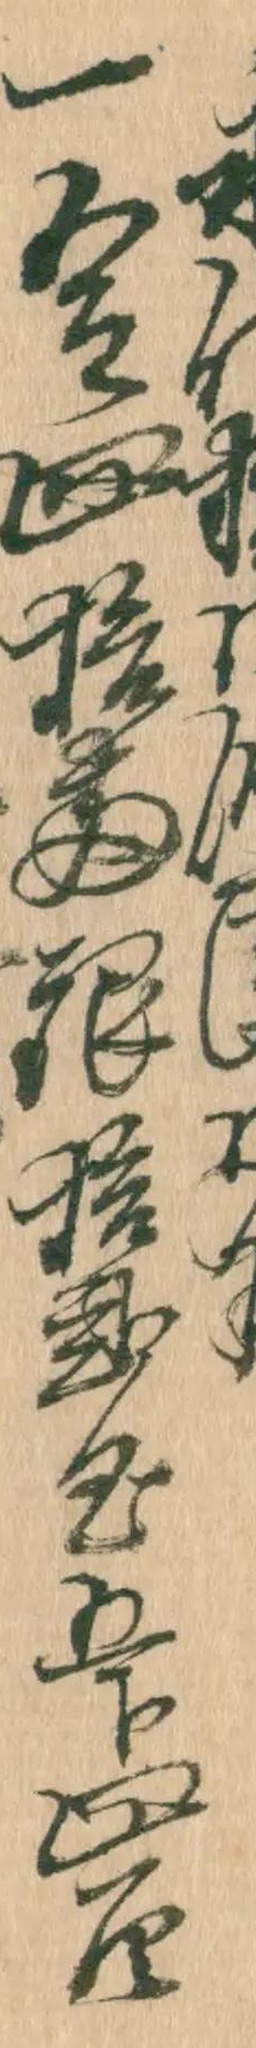一金四拾両銀拾弐匁五分四厘
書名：三橋 17巻. [8] 三橋小破御修復書留　但御奉行御掛リ替地震潰橋番屋　嘉永四亥年より安政二卯年迄　下
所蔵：国立国会図書館 National Diet Library, JAPAN
